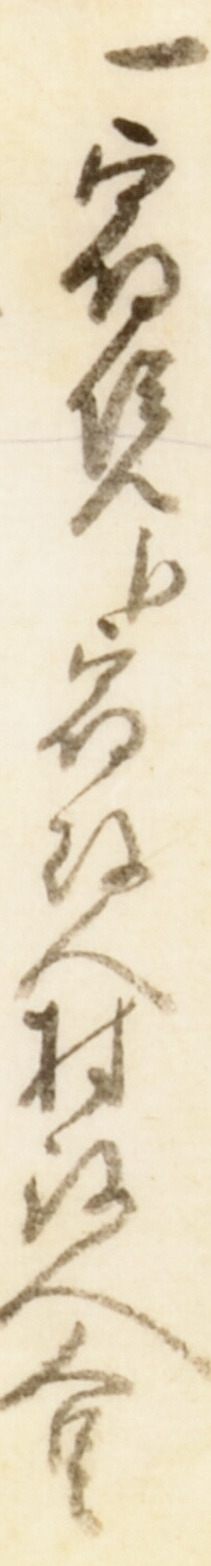一宿境え宿改人村役人人足
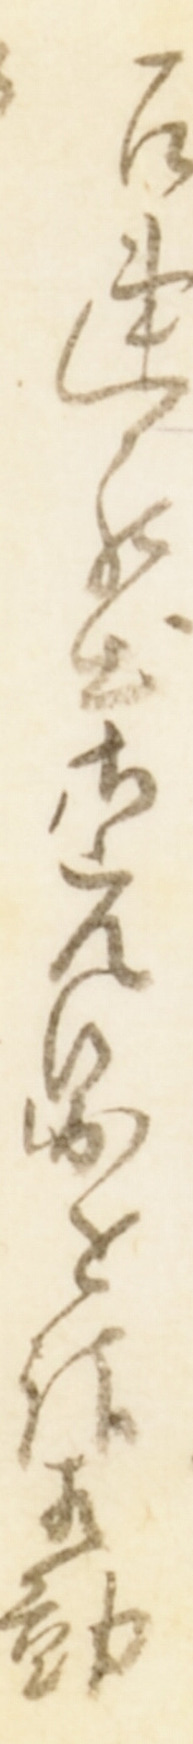召連罷出御差図を請相勤
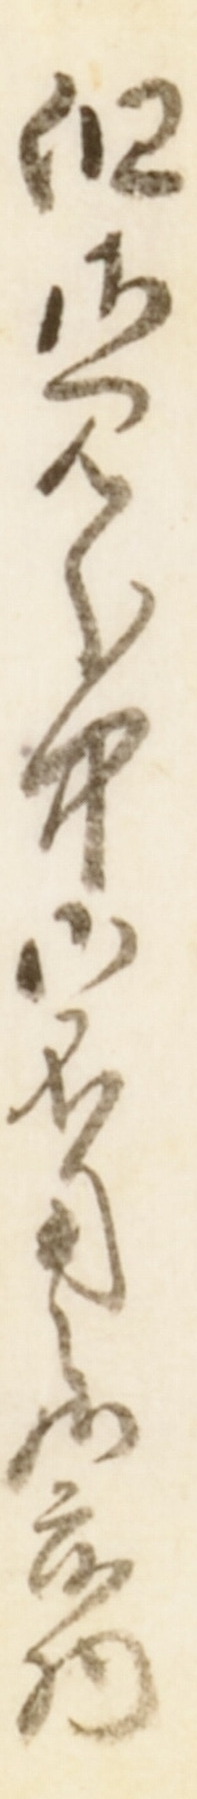但御見分中御不用之御荷物
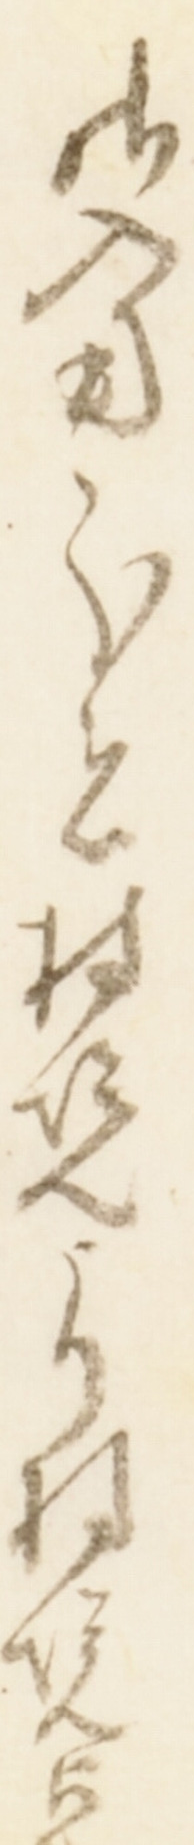御入用分者村境より村境迄
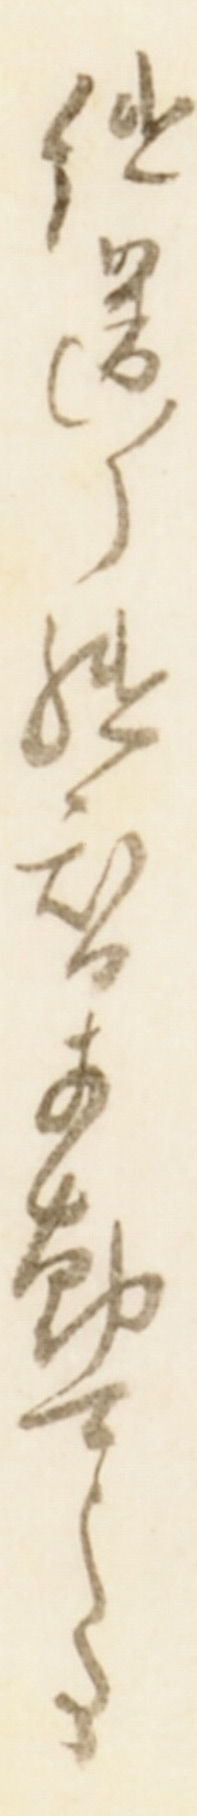継送り継替相勤可申事
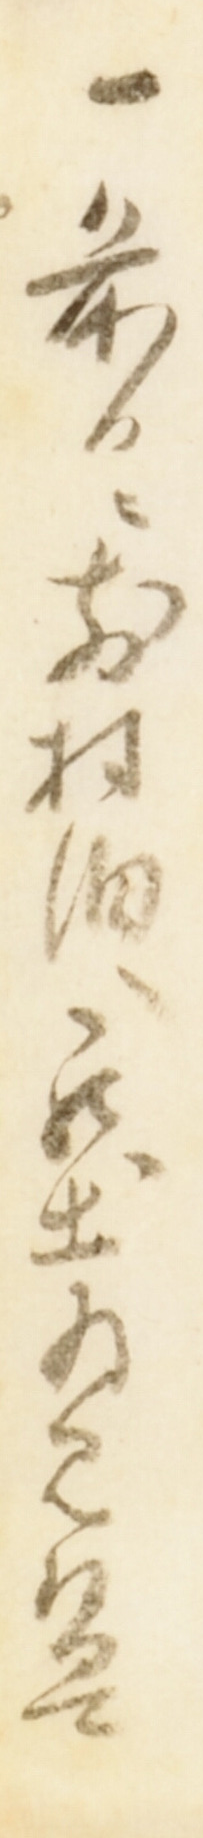一前日ニ前村泊へ罷出為見習可
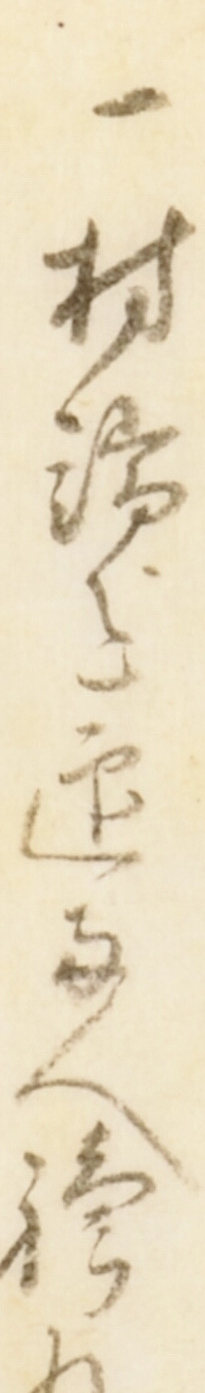一村端迄迎両人袴羽織
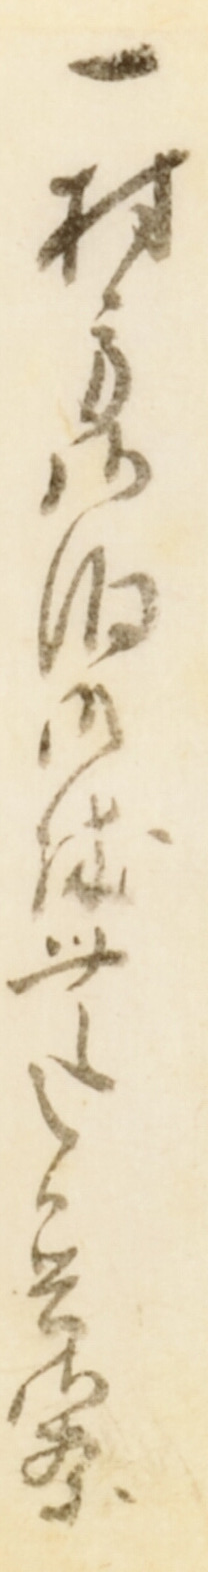一村方御泊御休無之候共御茶
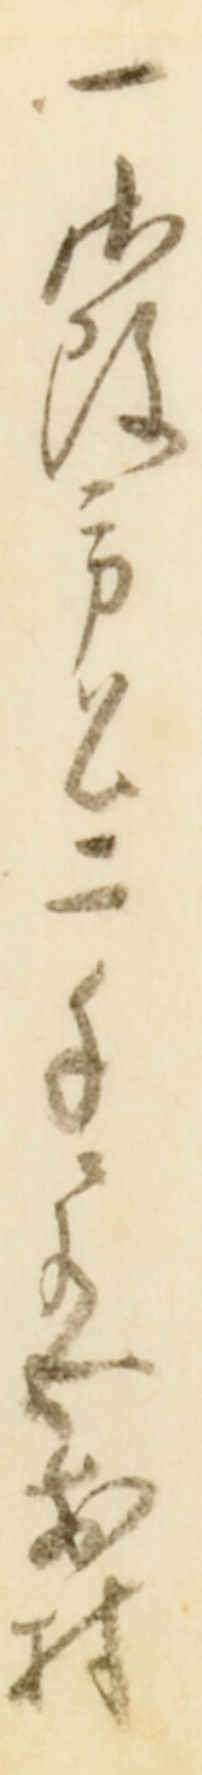一御改方と二手ニ相成前村
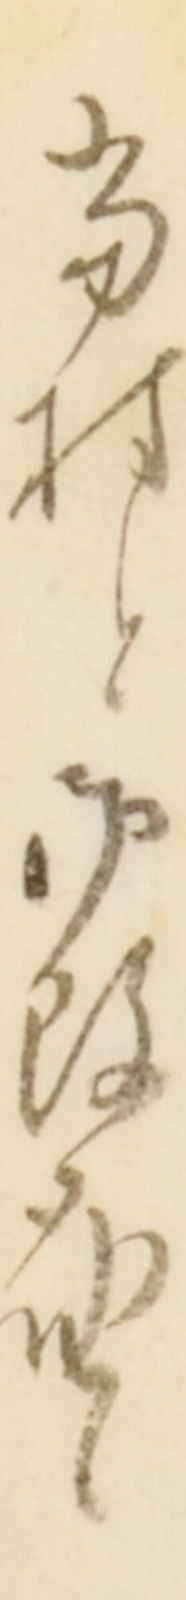当村と御改届候
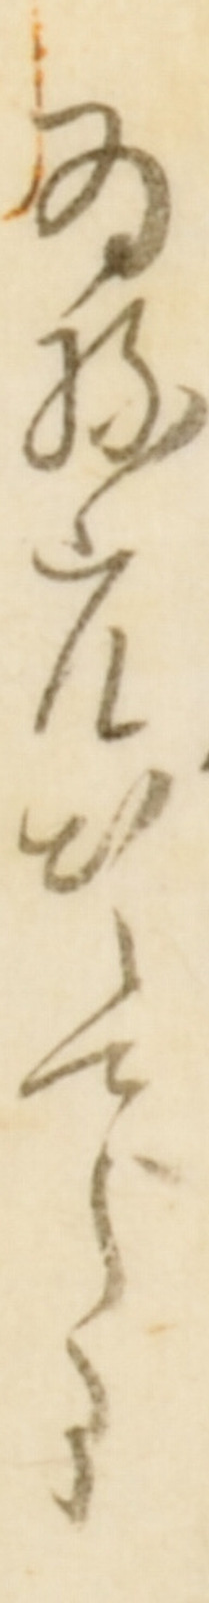為持差出し可申事
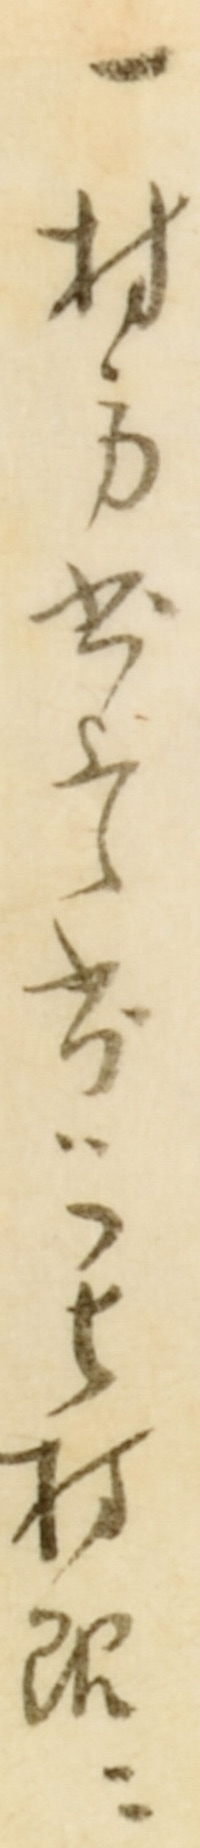一村方書上候書は其村限ニ

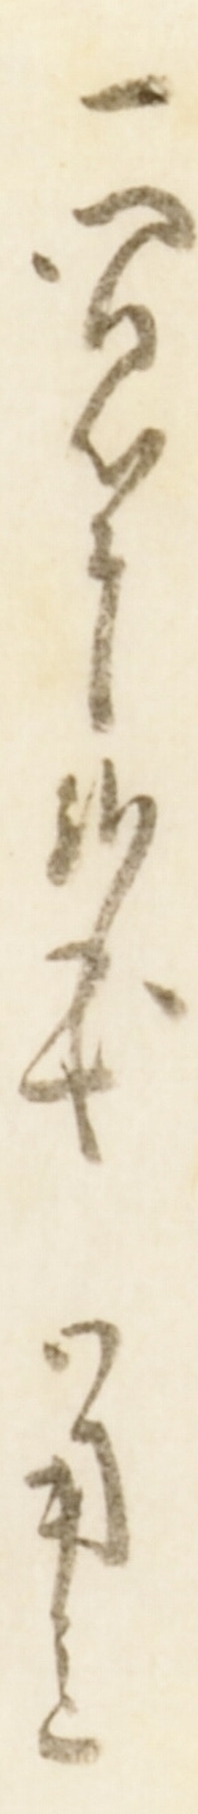一間竿弐本御用意
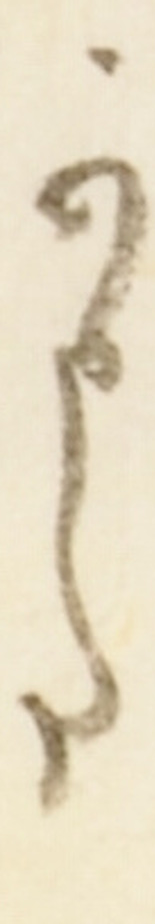可申候
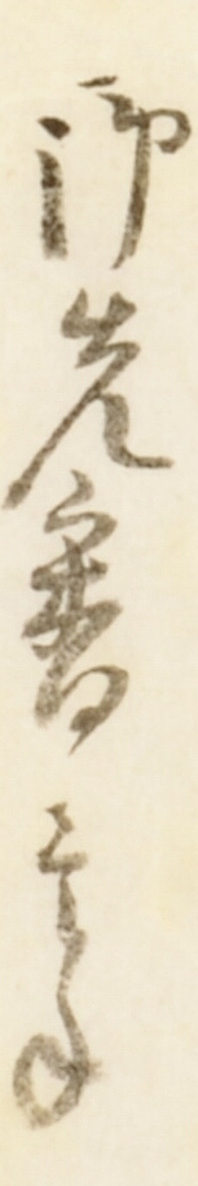御先番壱手
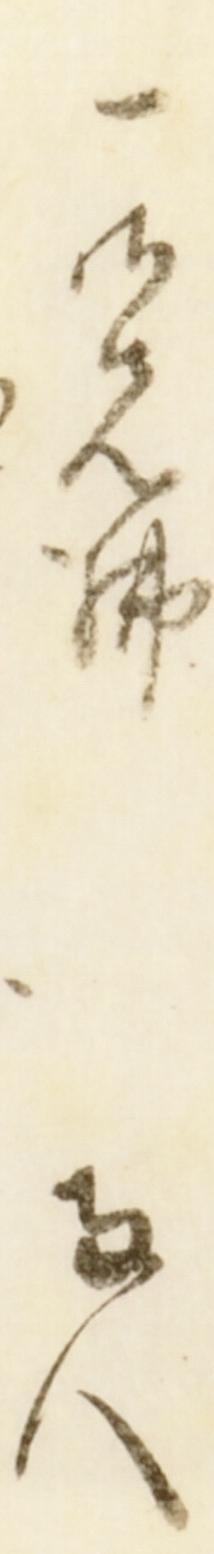一御先払五人
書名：（覚）
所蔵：伊那市立高遠町図書館・合同会社AMANE
